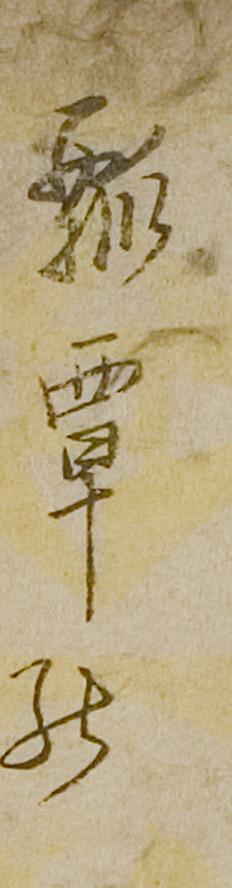瓢箪の
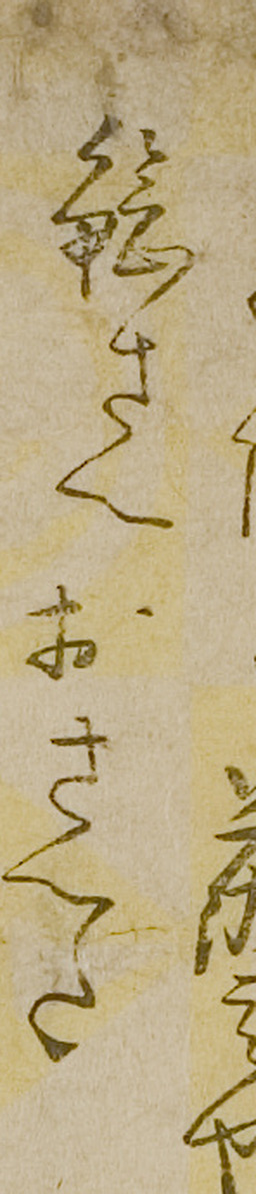鯰さへおさへた
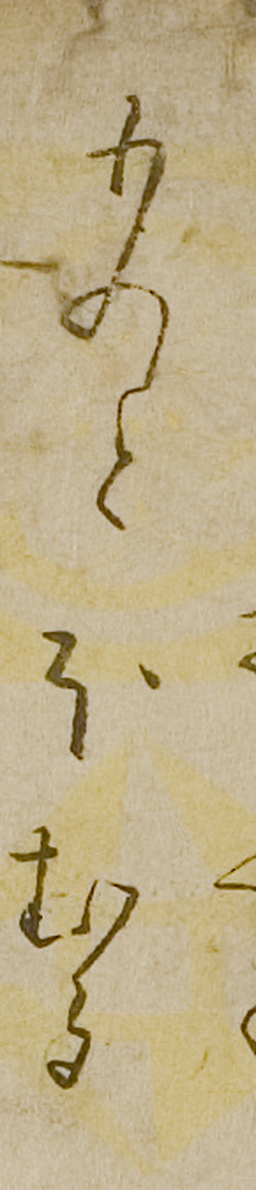ものとほむる
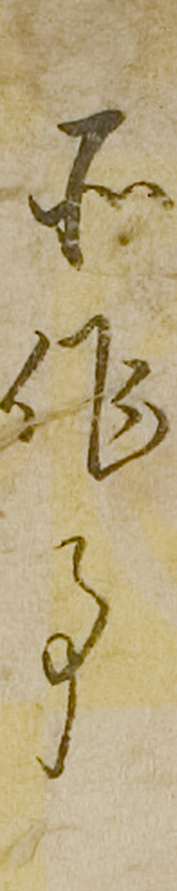所作事
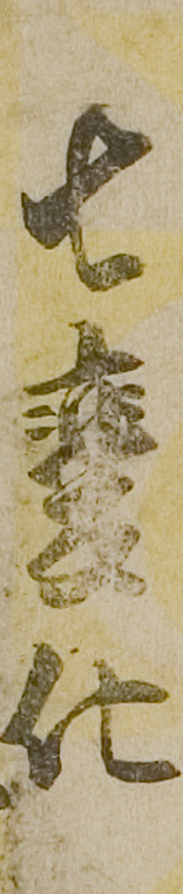七変化
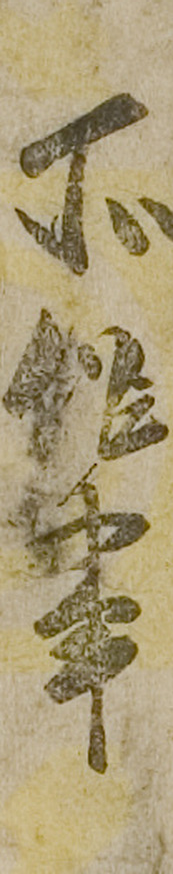所作事
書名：[中]村芝翫 七変化所作事の内
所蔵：東京大学総合図書館 General Library in the University of Tokyo, JAPAN
